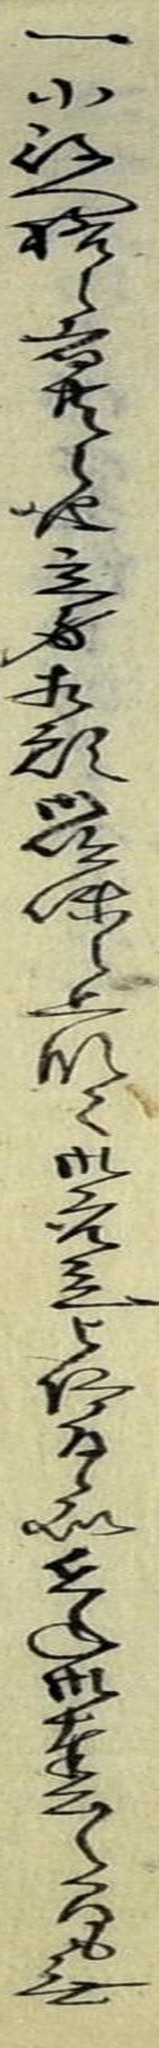一小役人格之者共之儀立身相願御吟味之上段々御取立被仰付候処近年御奉公之間も無
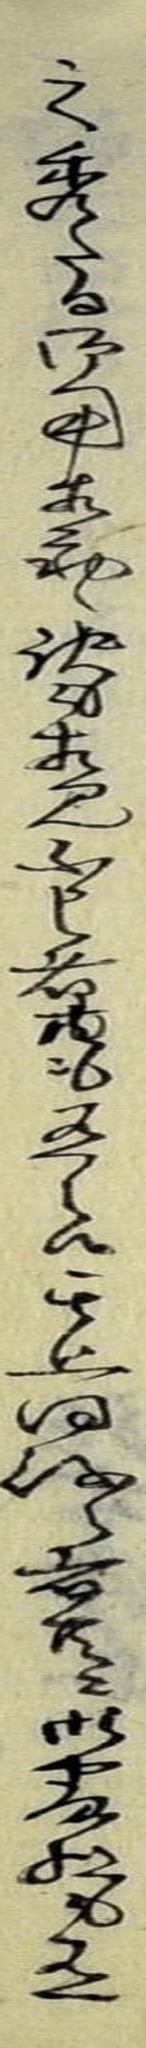之秀たる御用相勤候訳も相見不申者共も有之候其上同役之者共ニ御番組も有
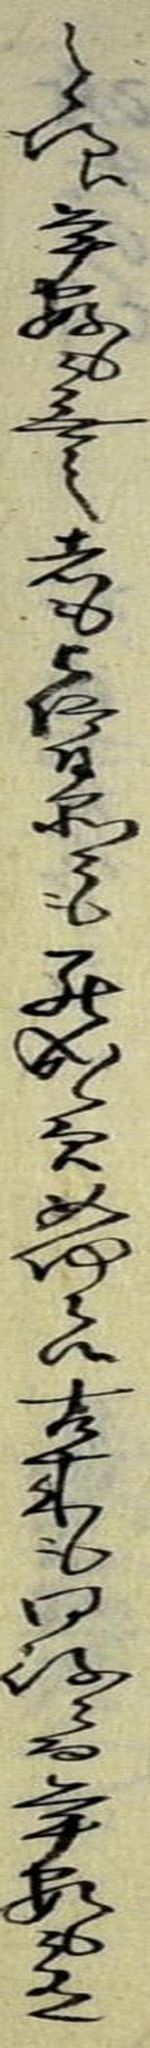之候得ハ年数も無之者も被仰付品ニも罷成候而ハ如何ニ候古来も同役ニ而年数も有
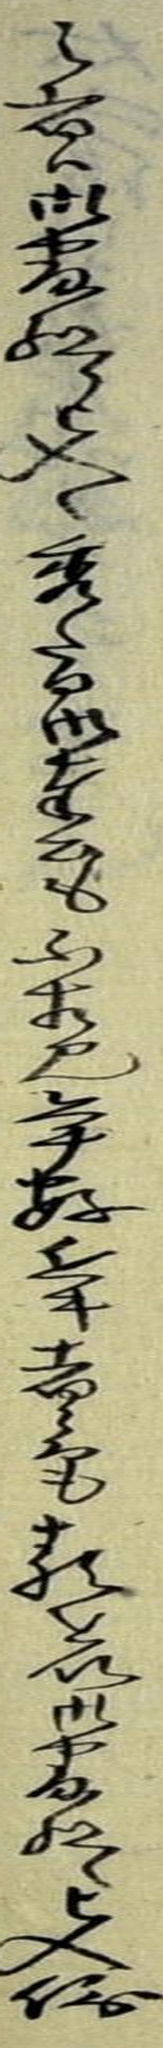之者ハ御番組へ被入候秀たる御奉公も不相見年数近キ者ニ而も類を以御番組へ被入儀
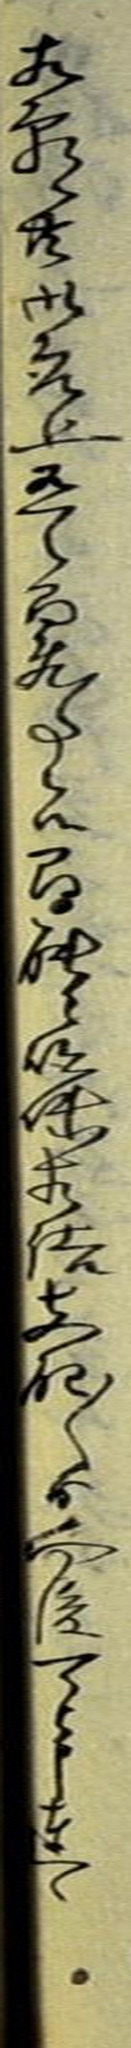相願候共御取上有之間敷事ニ候間能々吟味相詰支配〳〵ゟ向後可被申達候
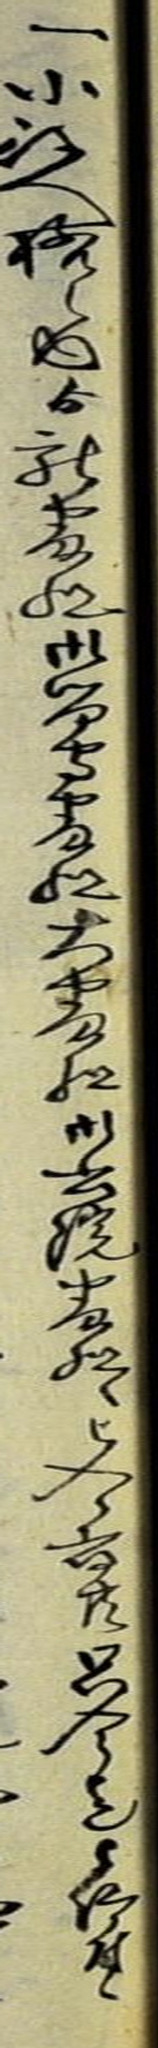一小役人格之内ゟ新番組御留守番組大番組御書院番組へ被入候者共只今迄被仰付候
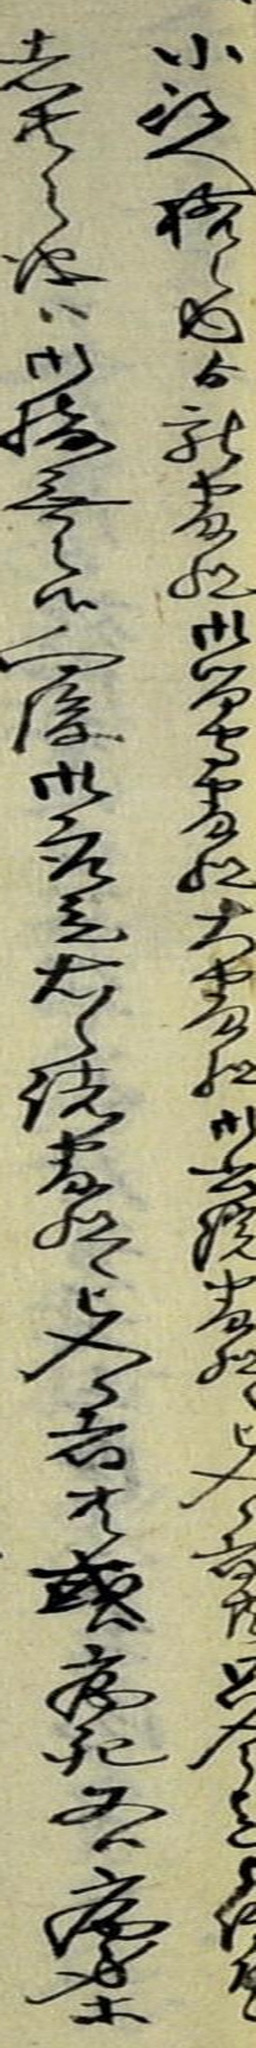者共之儀ハ御構無之候向後御取立右之諸番組へ被入候者共或ハ病死又ハ病身等
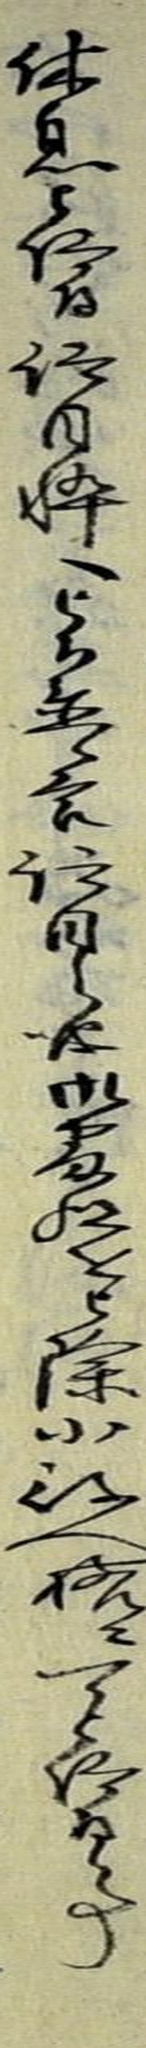休息被仰付跡目忰へ被下置候節跡目之儀御番組を被除小役人格ニ可被仰付
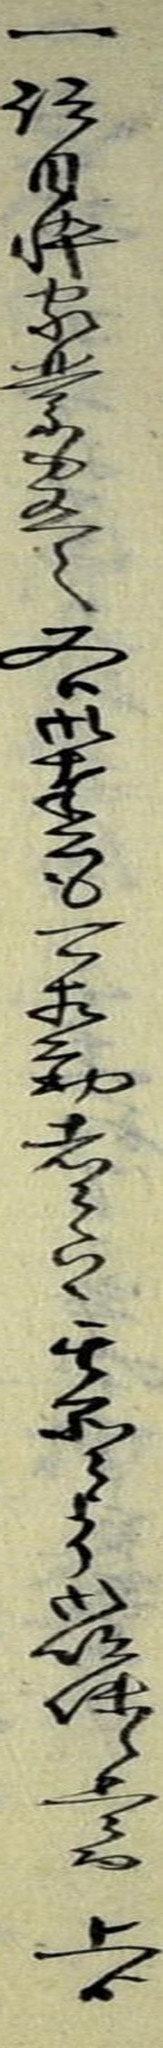一跡目忰家業も有之又ハ御奉公も可相勤者ニ候ハヽ其品ニより御吟味之上ニ而上ゟ
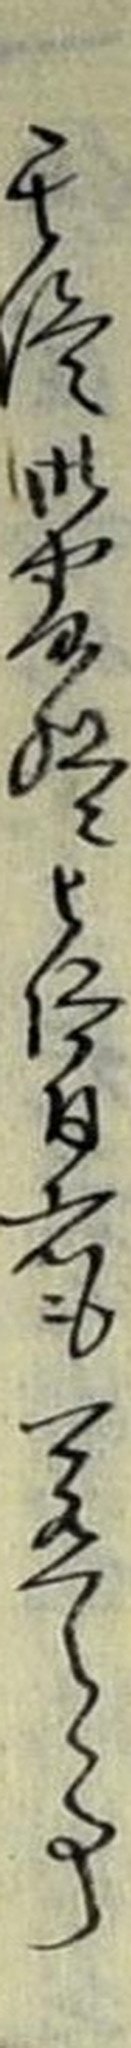其儘御番組ニ被仰付者も可有之事
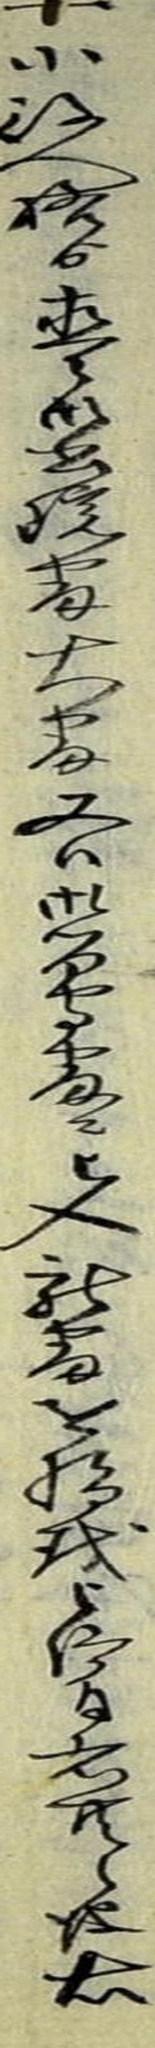一小役人格ゟ直ニ御書院番大番又ハ御留守番ニ被入新番を指越被仰付者共之儀右
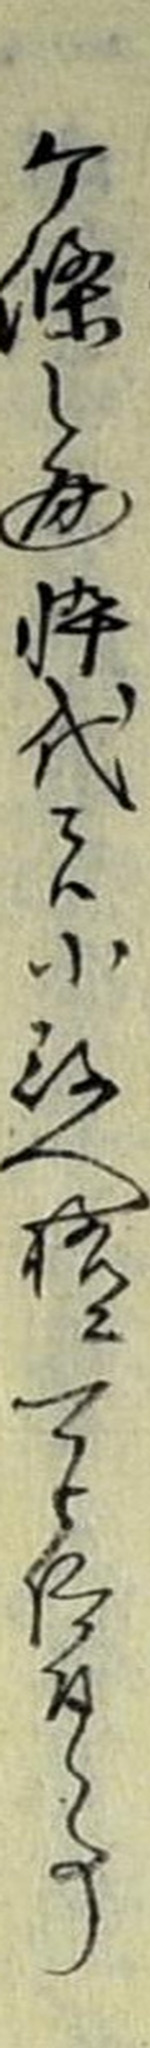ケ条之通忰代ニハ小役人格ニ可被仰付事
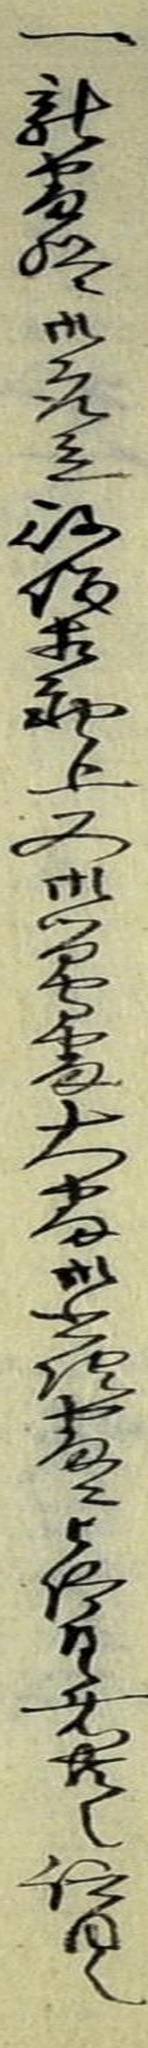一新番組ニ御取立役儀相勤候上又御留守番大番御書院番ニ被仰付候者共之跡目之
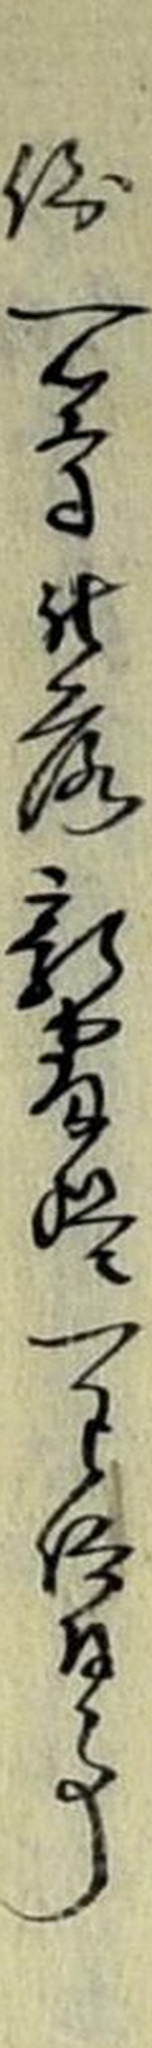儀一等被落新番組ニ可被仰付事
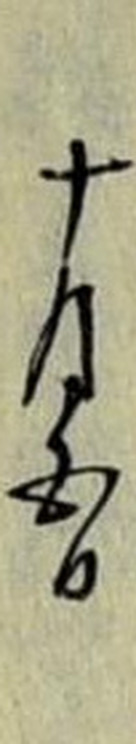十月五日
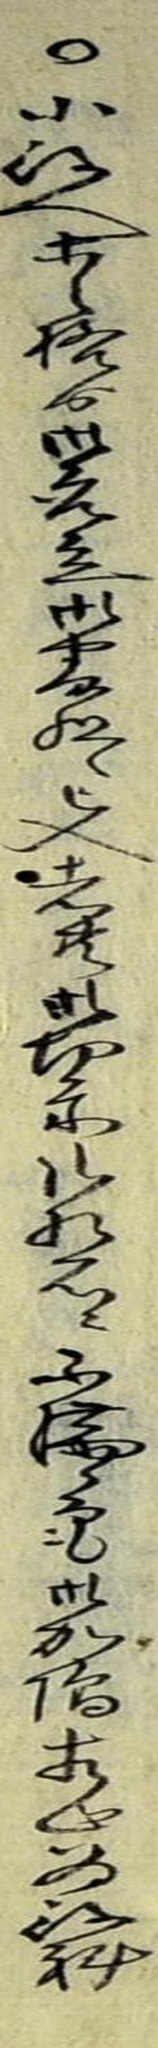〇小役人等之格ゟ御取立御番組へ被入者共御切米弐拾石ニ不満候而も御加増相止為役料
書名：命令之部 一
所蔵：福井県文書館 Fukui Prefectural Archives
